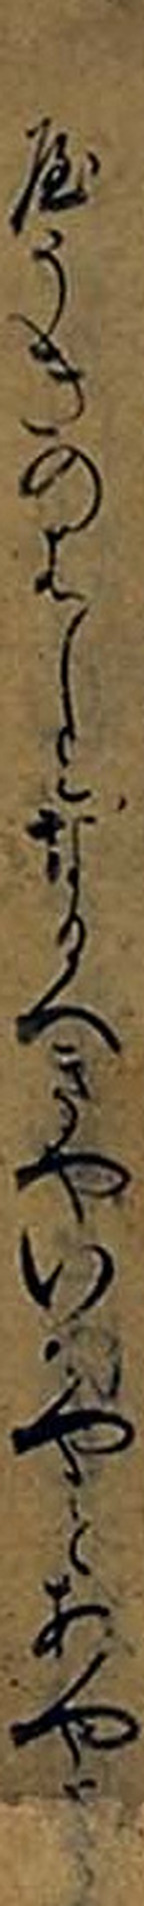やうきのはしとなるへきやいやとあや
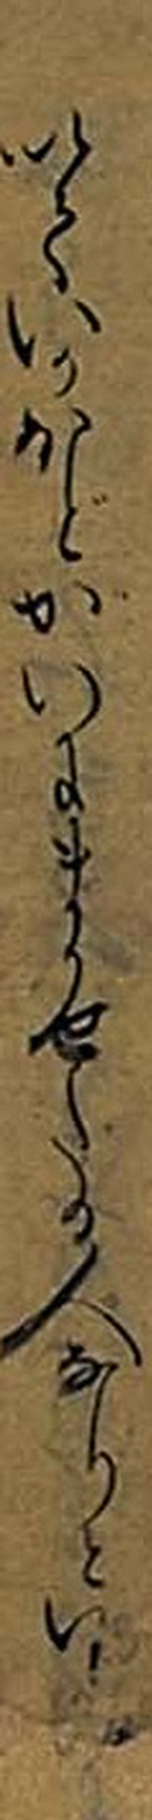以ていかほどがいにまかせたる人なりとい
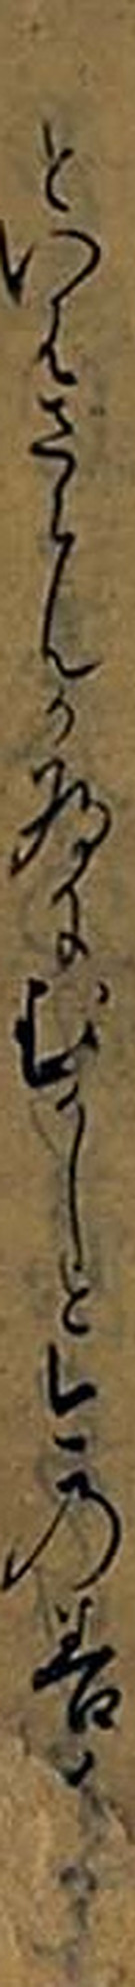といはざらんか為にむかしと今の善
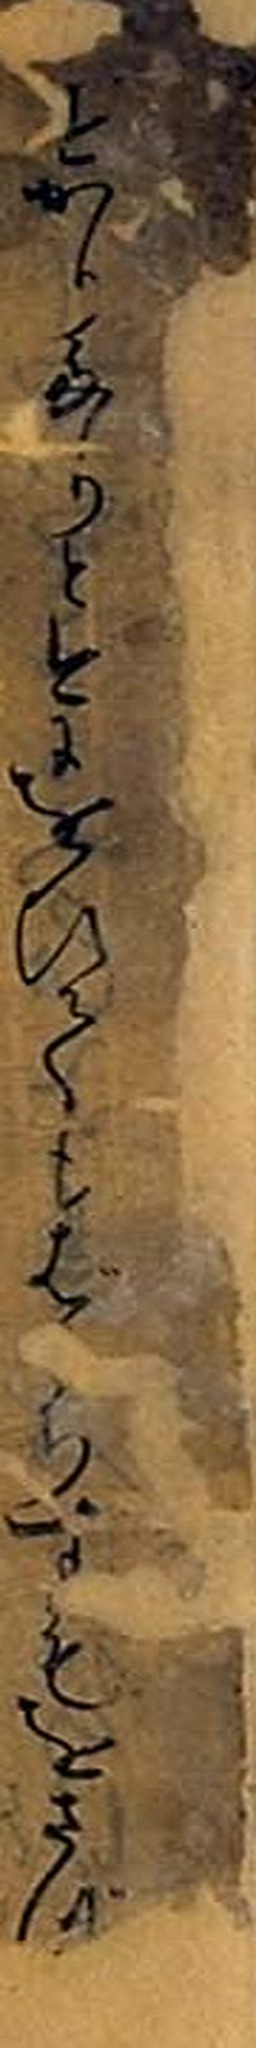かりたりと今にをひてもばちすもをさ
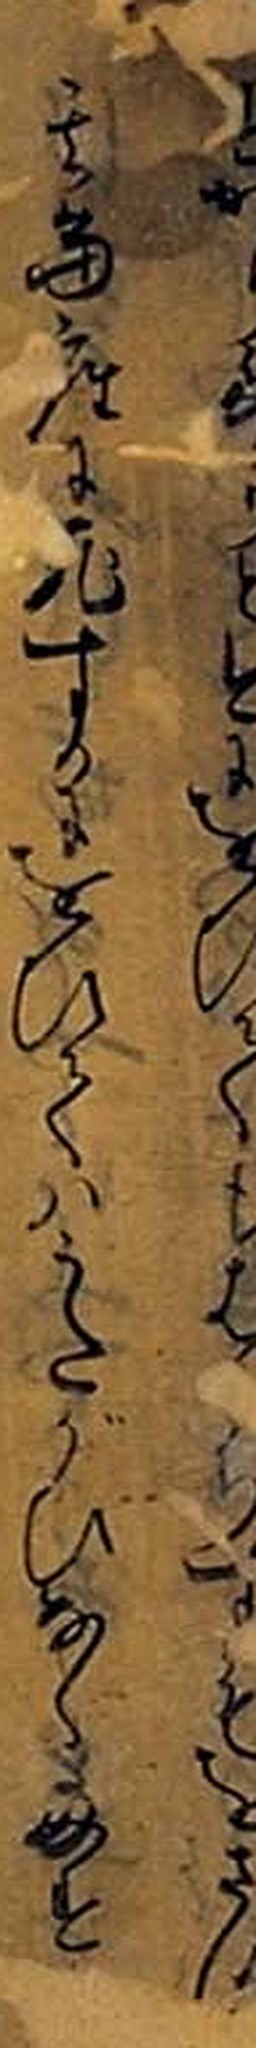其当座に死するにをひてはうたがひなくたす
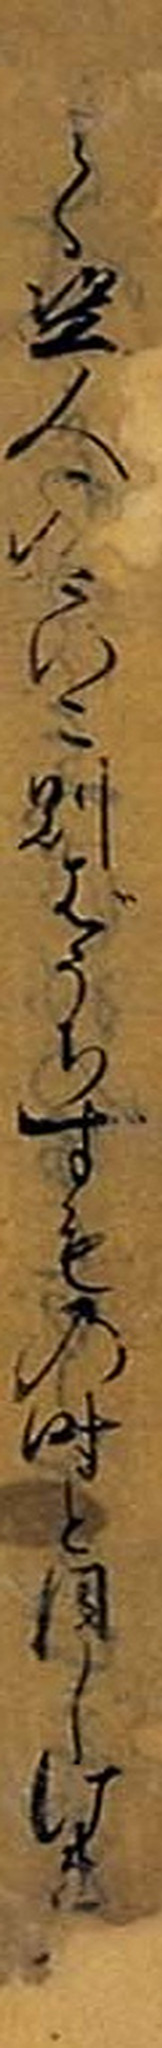く盗人のさいこ則ばうちずもの時と同しけれ
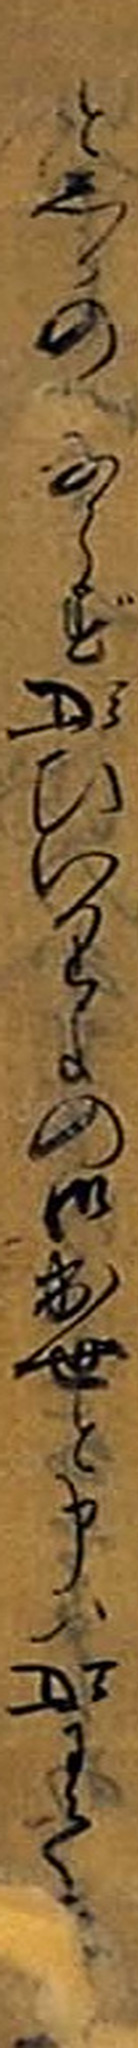としかのならずⅮひいりよの御出世と申はⅮにて
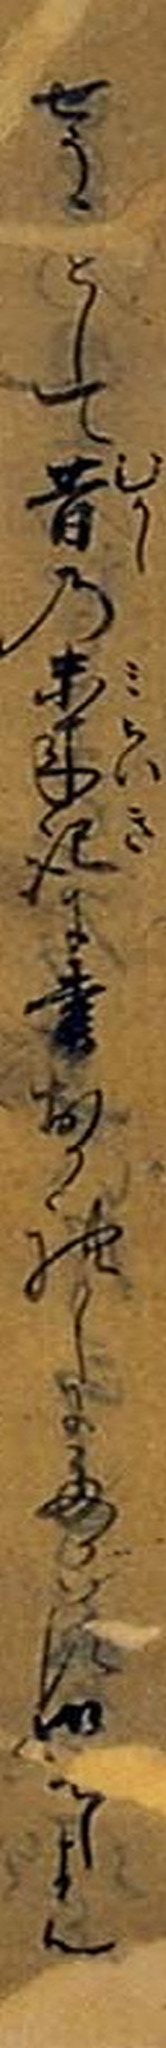せうことして昔の未来記に書おかれしにたがはず御しよん
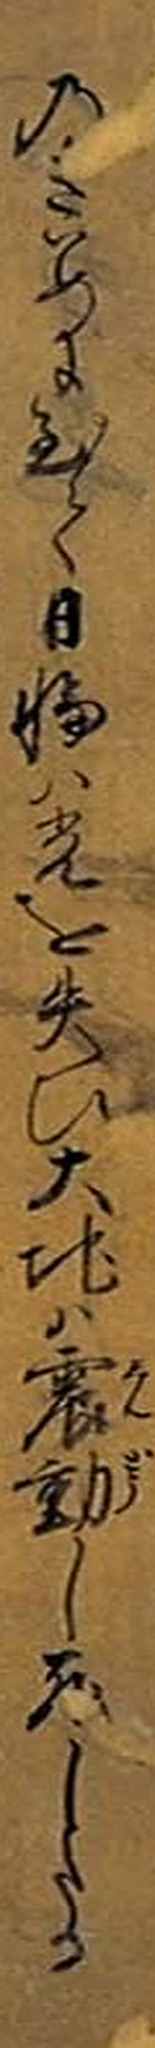のきはめに至て日輪は光を失ひ大地は震動し死したる
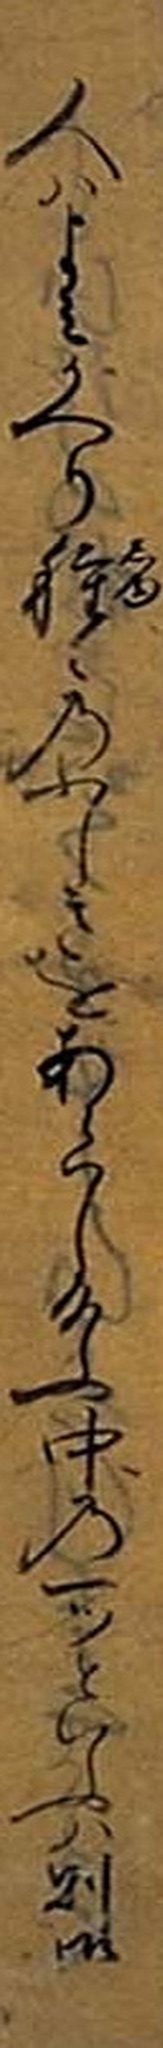人はよみがへり種ゝのふしきをあらはし給ふ中の一ツといふは則御
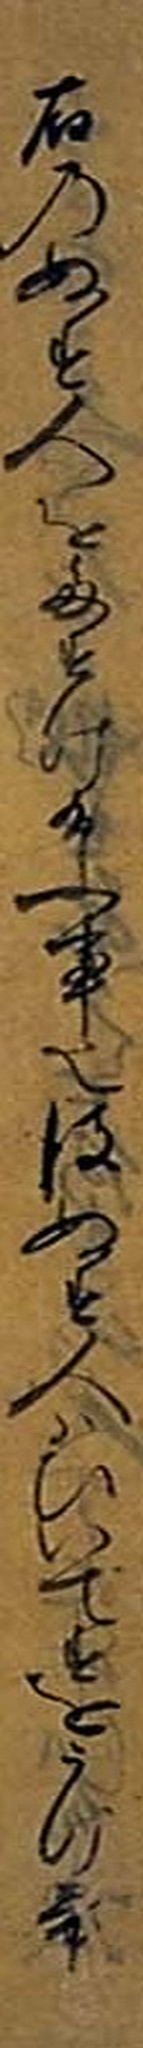右のぬす人をたすけ給ふ事也彼ぬす人はひいですをうけ帝
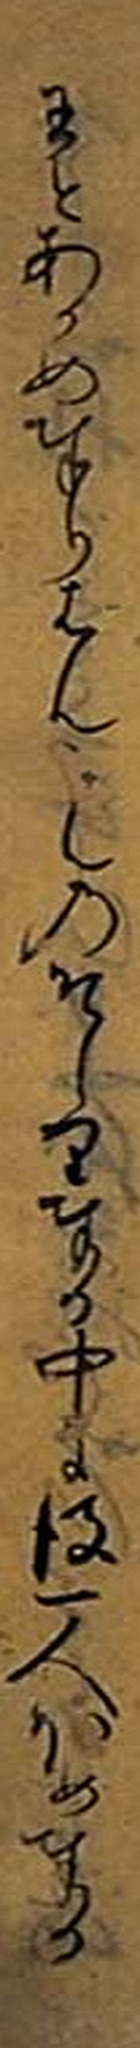王とあがめ奉りはんんのそしり奉る中に彼一人ほめ奉る
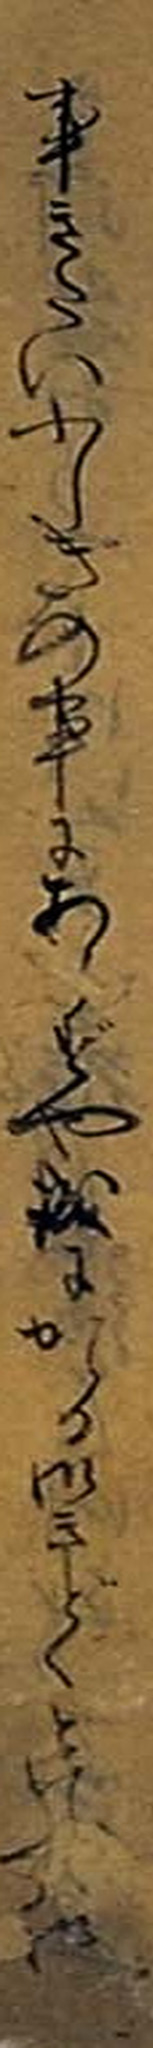事きたいふしぎの事にあらずや誠にかゝる御きどくといふは御

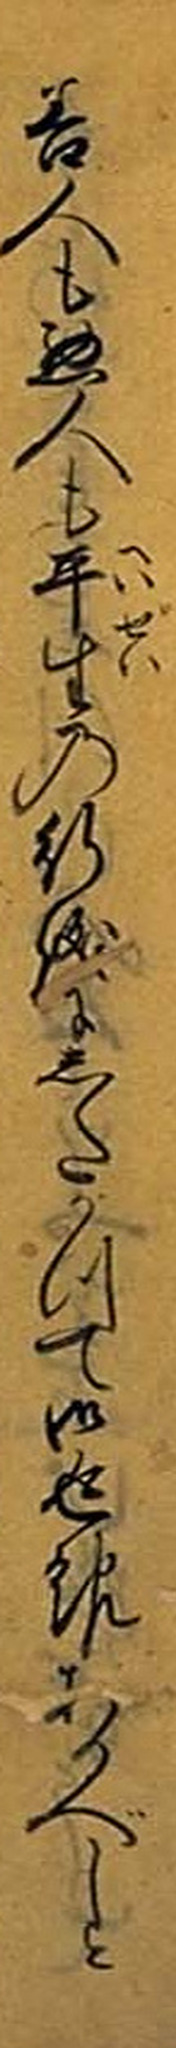善人も悪人も平生の行儀にしたがつて御返報あるべしと
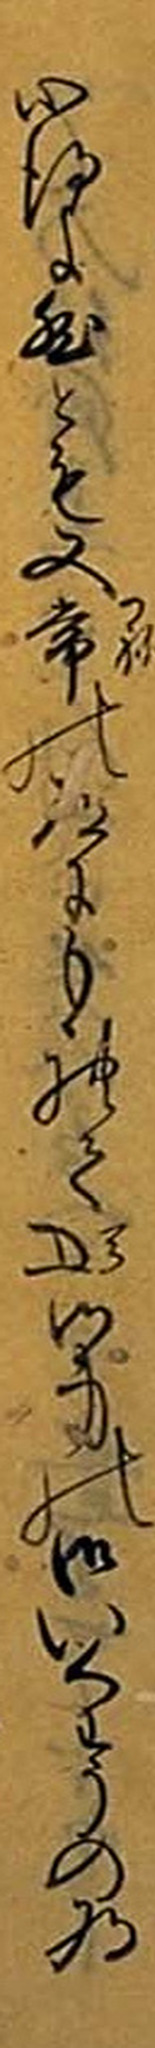心得よ然とも又常の道にもれてⅮ御身の御いくわうの為
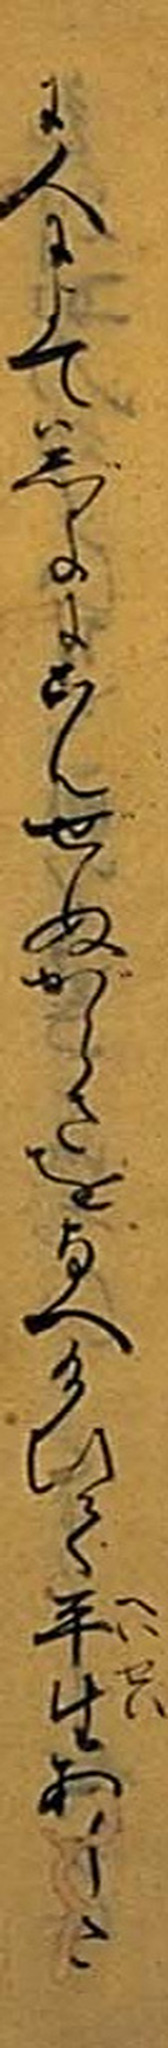に人によてはじよにこんせぬがらさを与へ給ひて平生あしき
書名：ぎやどぺかどる
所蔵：東京大学総合図書館 / General Library in the University of Tokyo
